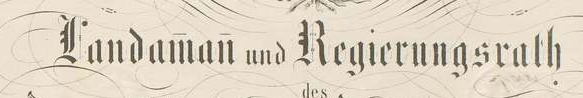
Landammann und Regierungsrath
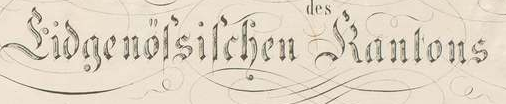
Eidgenössischen Kantons
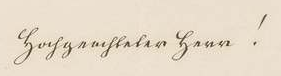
Hochgeachteter Herr!
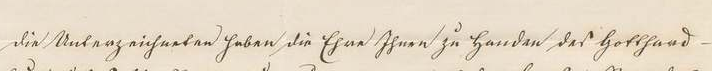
Die Unterzeichneten haben die Ehre Ihnen zu Handen des Gotthard -
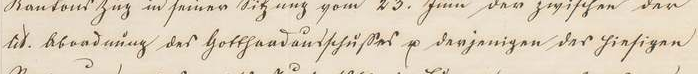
tit. Abordnung des Gotthardausschusses & derjenigen des hiesigen
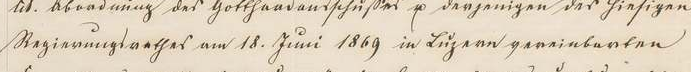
Regierungsrathes am 18. Juni 1869 in Luzern vereinbarten
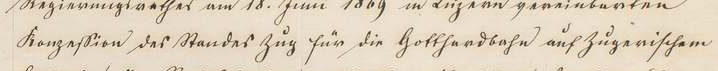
Konzession des Standes Zug für die Gotthardbahn auf Zugerischem
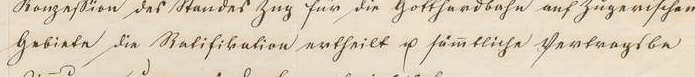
Gebiete die Ratifikation ertheilt & sämmtliche Vertragsbe-
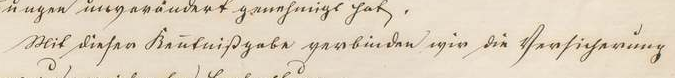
Mit dieser Kenntnißgabe verbinden wir die Versicherung
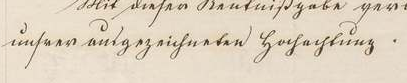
unserer ausgezeichneten Hochachtung.
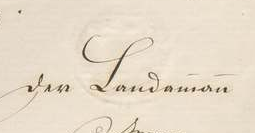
Der Landammann:
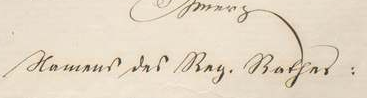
Namens des Reg.Rathes:
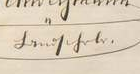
Landschrbr.
